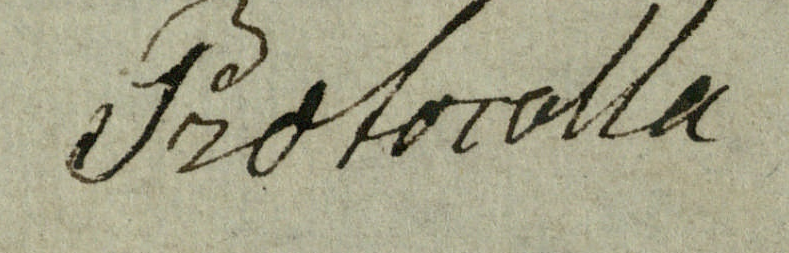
Protocolla
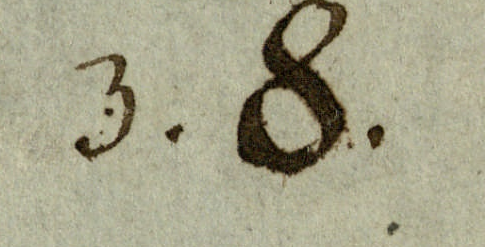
3.8.
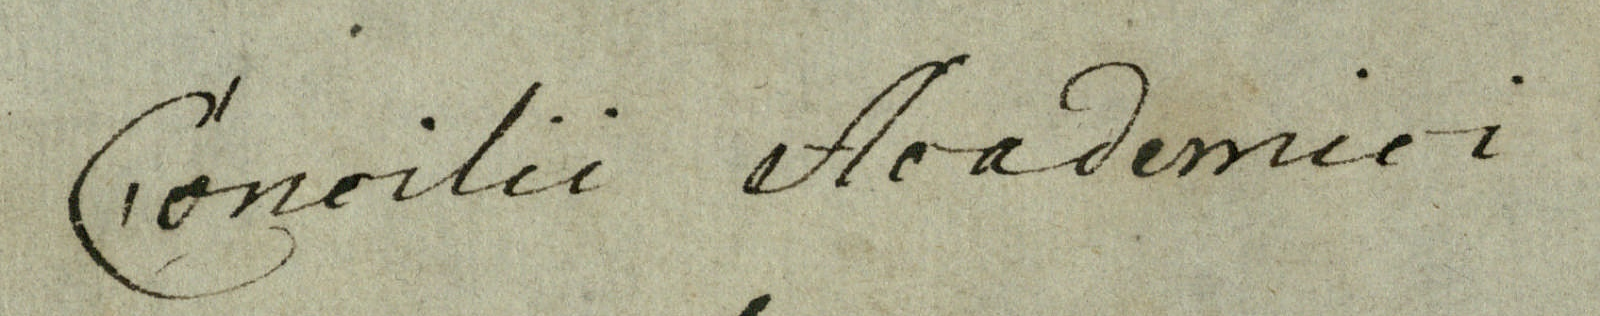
Concilii Academici
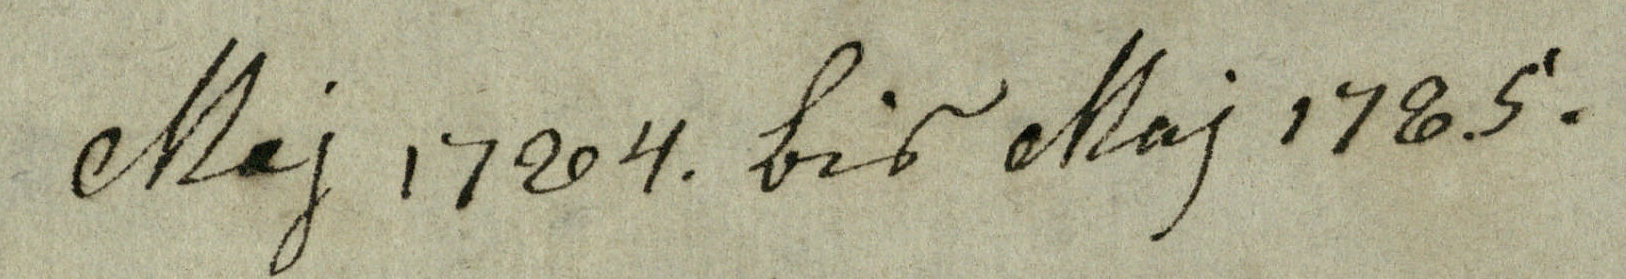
Maj 1784 bis Maj 1785.
